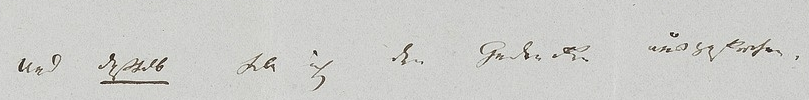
und deßhalb habe ich den Gedancken ausgesprochen.
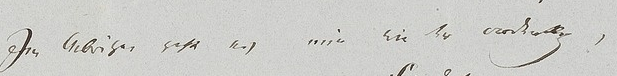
Im Uebrigen geht es mir wieder ordentlich,
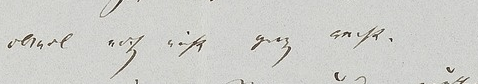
obwol noch nicht ganz recht.
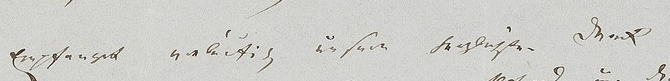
Empfanget vorläufig unsern herzlichsten Danck
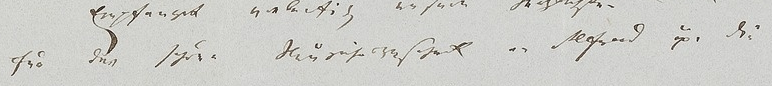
für das schöne Neujahrsgeschenck an Alfred &. die
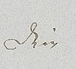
Dein
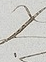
Ed.
